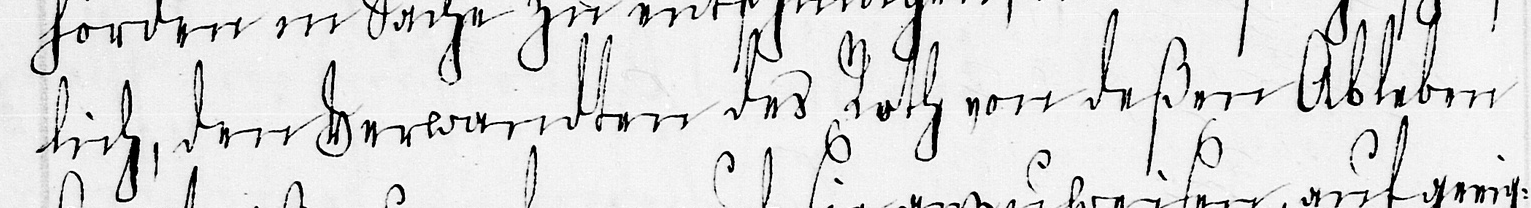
lich, den Verwandten des Roth von deßen Ableben
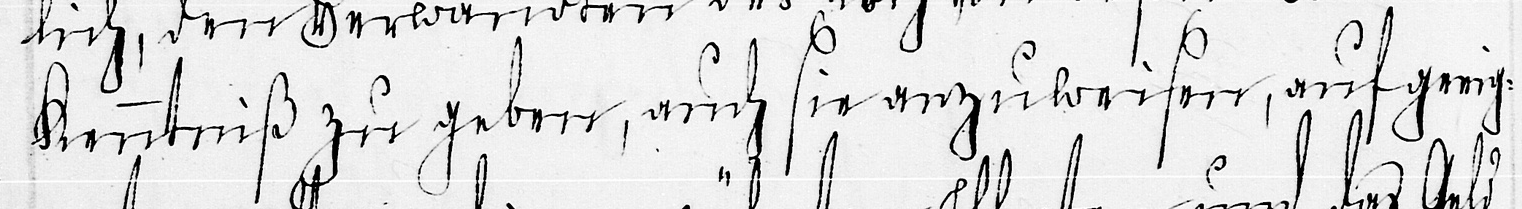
Kenntniß zu geben, auch sie anzuweisen, auf geei¬
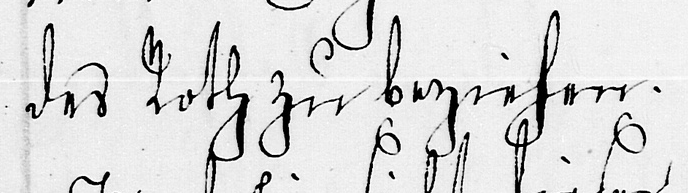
des Roth zu beziehen.
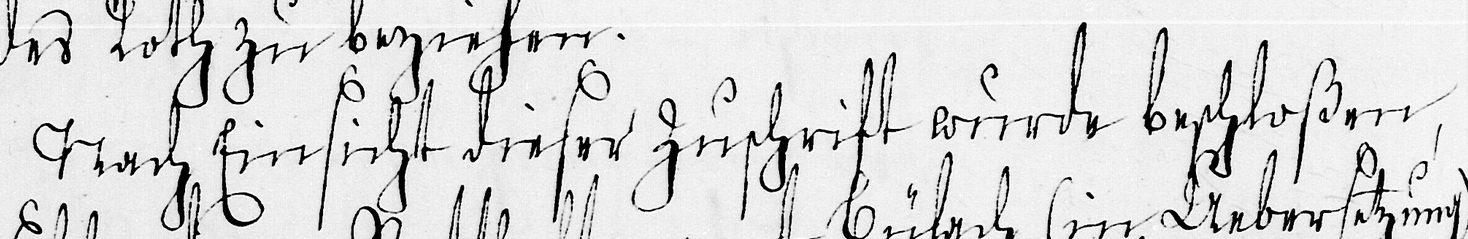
Nach Einsicht dieser Zuschrift wurde beschloßen,
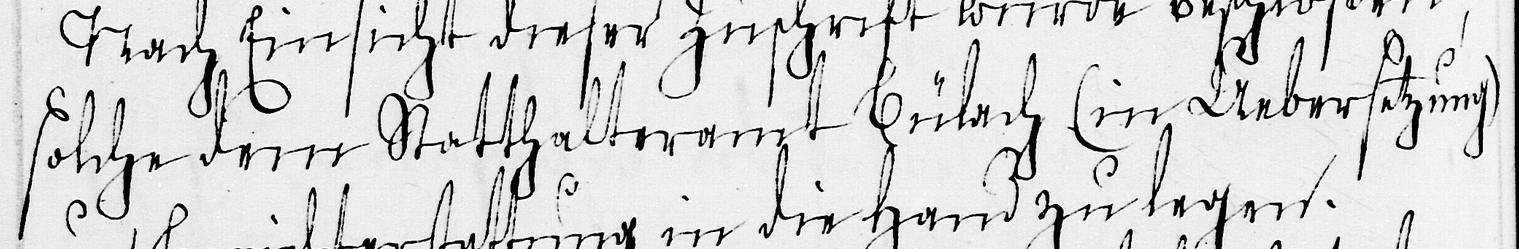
solche dem Statthalteramt Bülach (in Uebersetzung)
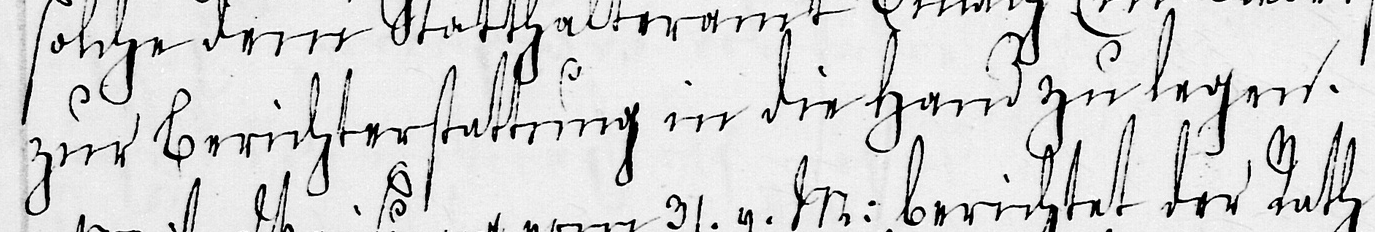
zur Berichterstattung in die Hand zu legen.
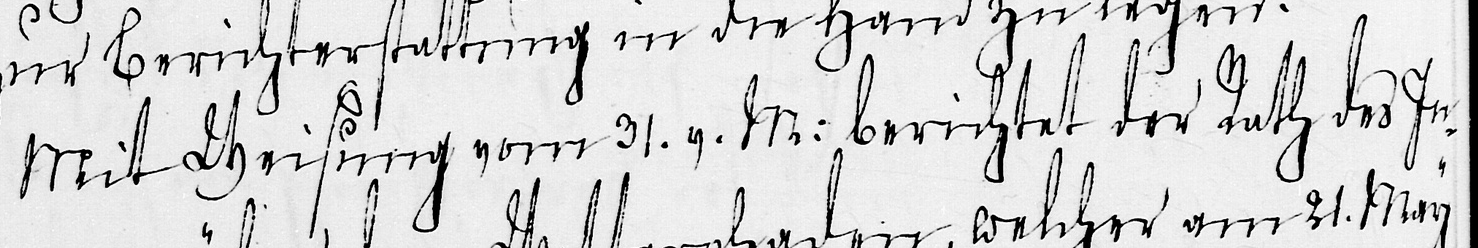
Mit Weisung vom 31. v. M: berichtet der Rath des In¬
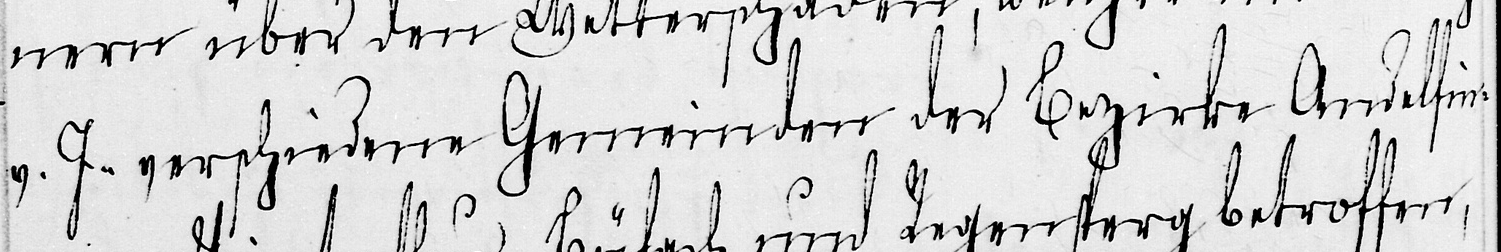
v. J. verschiedene Gemeinden der Bezirke Andelfin¬
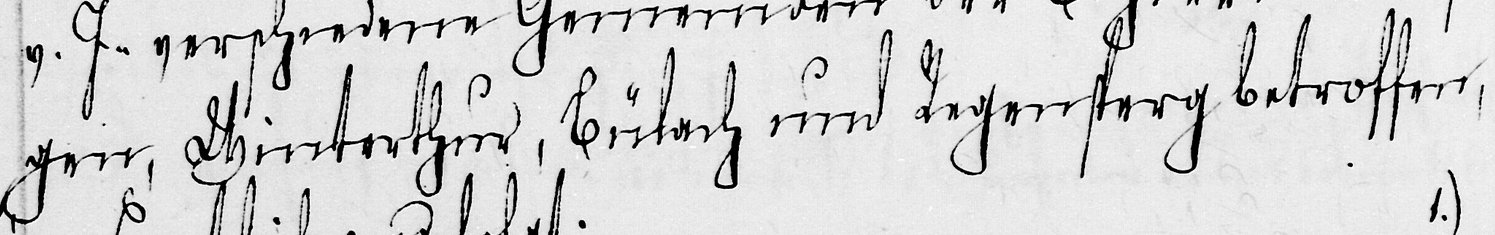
gen, Winterthur, Bülach und Regensperg betroffe¬
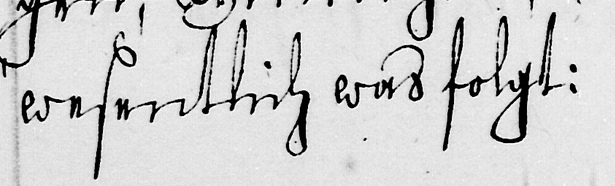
wesentlich was folgt:
